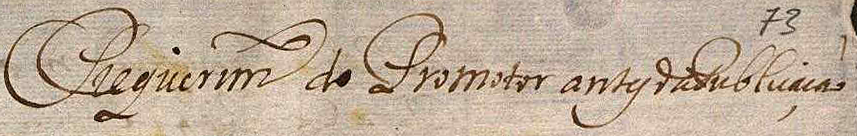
Requerimto do Promotor antes da Publicaçaõ
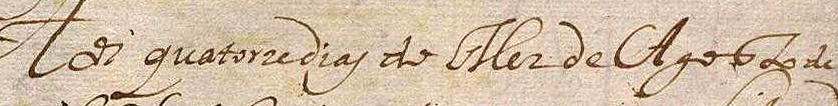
Aos quatorze dias do Mez de Agosto de
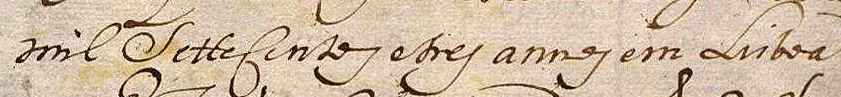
mil SetteCentos e tres annos em Lisboa
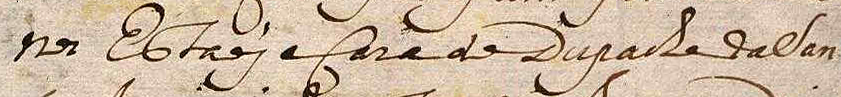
nos Estaos e Caza do Despacho da San
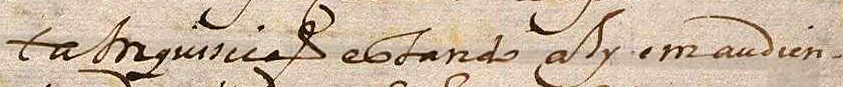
ta Inquisiçaõ estando ahy em audien
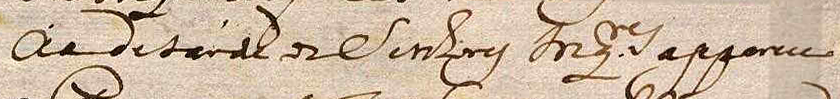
cia de tarde os Senhores Inq.res appareceo
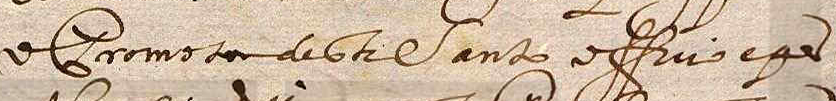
o Promotor deste Santo officio e por
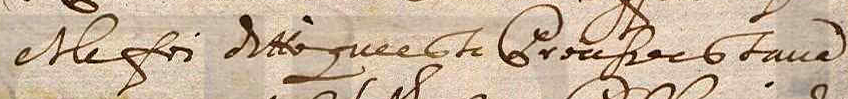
elle foi ditto que este Processo estaua
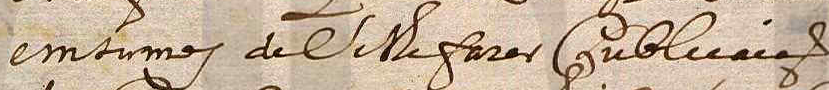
em termos de Se lhe fazer Publicaçaõ
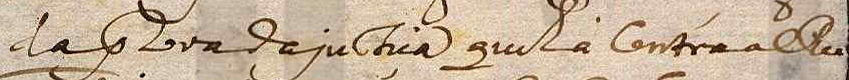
da prova da justiça que há Contra a Ree
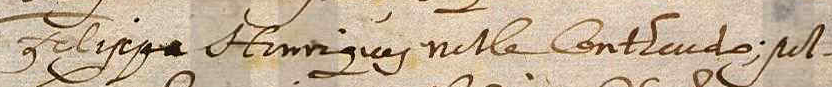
Felippa Henriques nelle Contheudo; pel
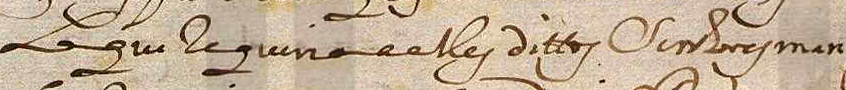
Lo que Requeria a elles dittos Senhores man
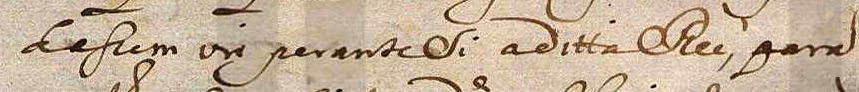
dassem vir perante Si a ditta Ree, para
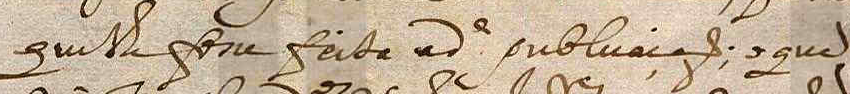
que lhe fosse feita a da publicaçaõ; o que
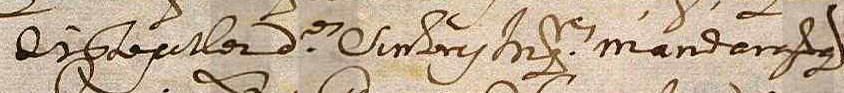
disto pellos d.os Senhores Inq.res mandaraõ q̄
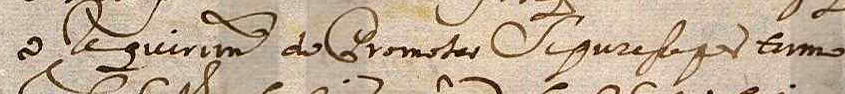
o Requirimto do Promotor Se puzesse por termo
